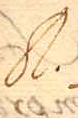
R.
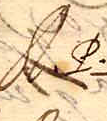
R. P.
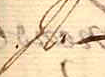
R.
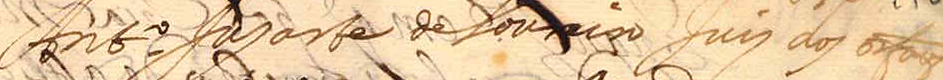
Ant.o Juzarte de Loureiro Juiz dos orfãos
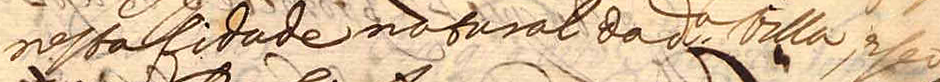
nesta Cidade natural da d.a villa, E seo
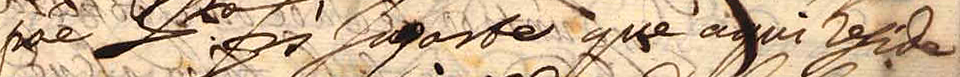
pae P.o frs̄ Juzarte que aqui reside
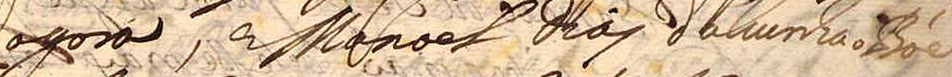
agora, E ManoeL dias d'alcunha o Boé
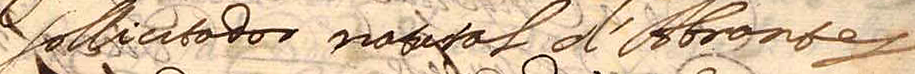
sollicitador naturaL d'Abrantes
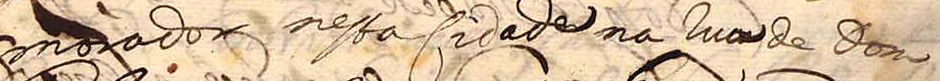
morador nesta Cidade na Rua de dom
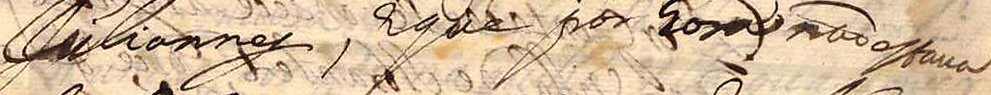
Juliannes, E que por hora não estaua
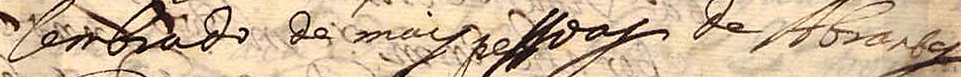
lembrado de mais pessoas de Abrantes
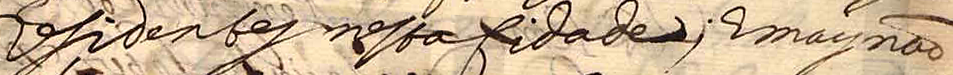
residentes nesta Cidade; E mais não
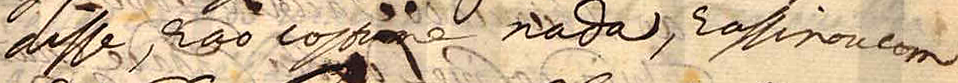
disse, E ao costume nada, E assinou com
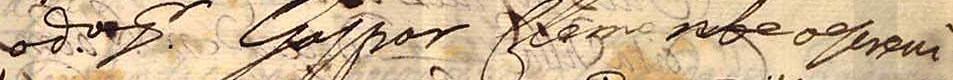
o d.o s.r Gaspar Clemente o escreui
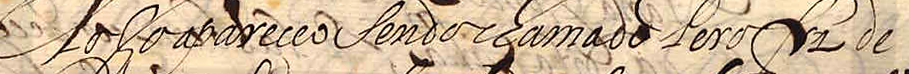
E Logo apareceo sendo chamado Pero frz̄ de
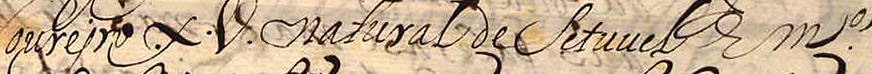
Loureiro X. V. naturaL de Setuuel E m.or
